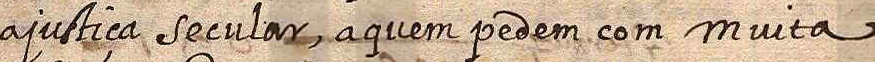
a justiça secular, a quem pedem com muita
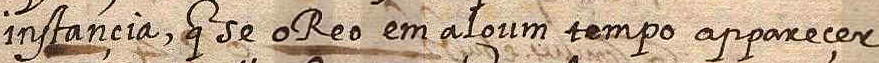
instancia, q̄ se o Reo em algum tempo apparecer
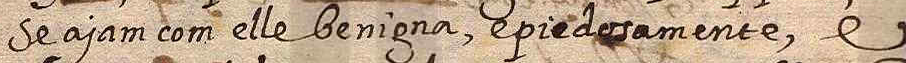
se ajam com elle benigna, e piedosamente, e
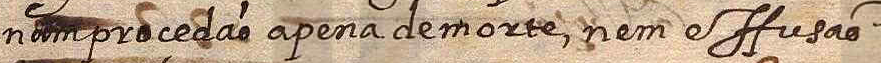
nam procedão a pena de morte, nem effusão
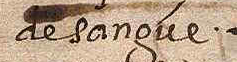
de sangue
